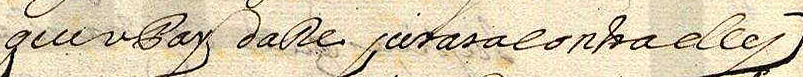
que o Pay da Re jurata contra elles
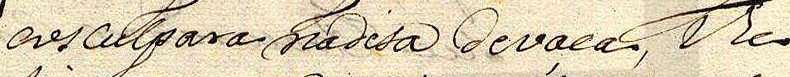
e os culpara na dita devaça, lhe
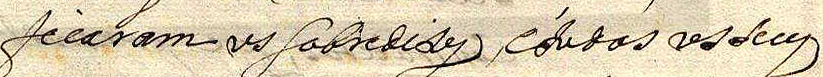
ficaram os sobreditos, e todos os seus
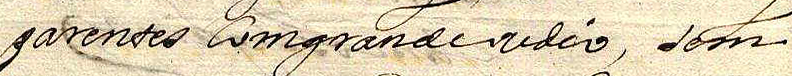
parentes com grande odio, sem
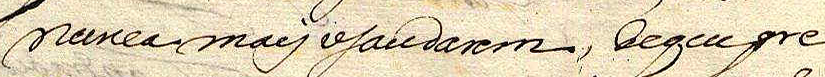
nunca mais o saudarem, de que pre
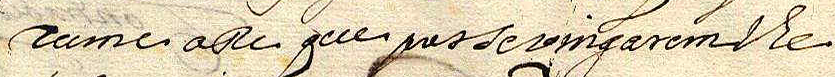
zume a Re que porse vingarem lhe
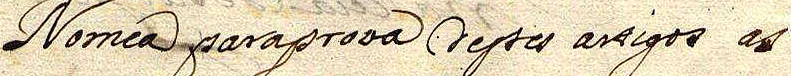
Nomea para prova destes artigos as
